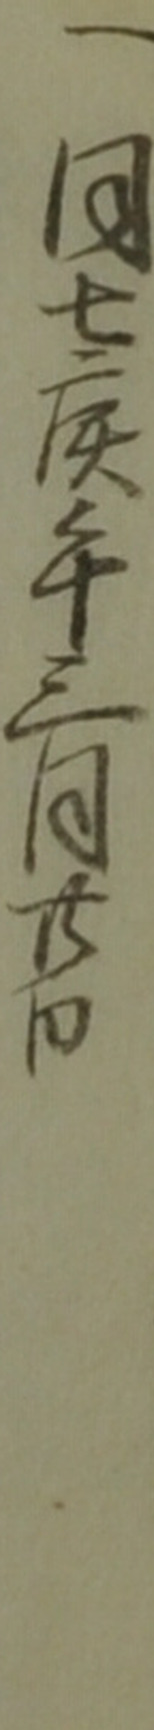一同七庚午三月廿日
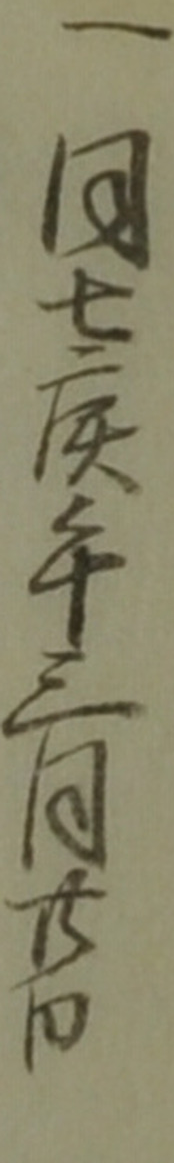一同七庚午三月廿日
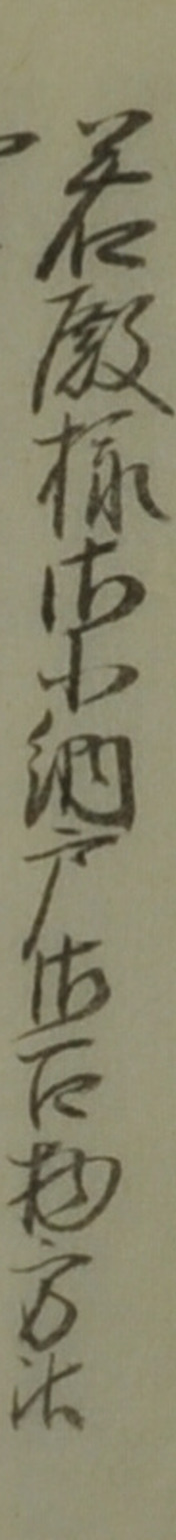若殿様御小納戸御召物方被
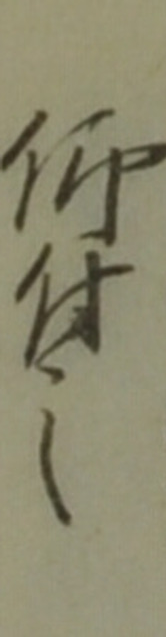仰付之
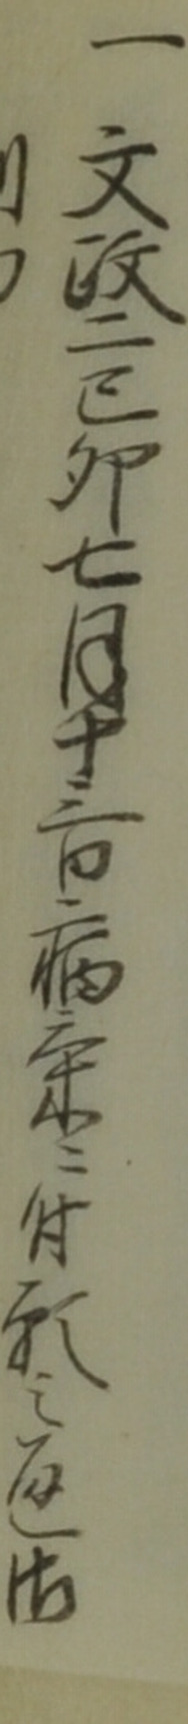一文政二己卯七月十三日病気ニ付願之通御
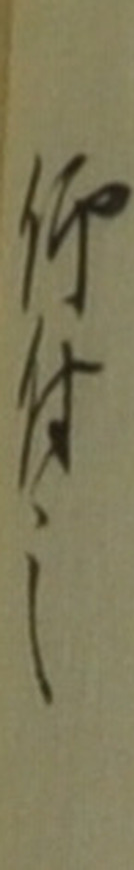仰付之
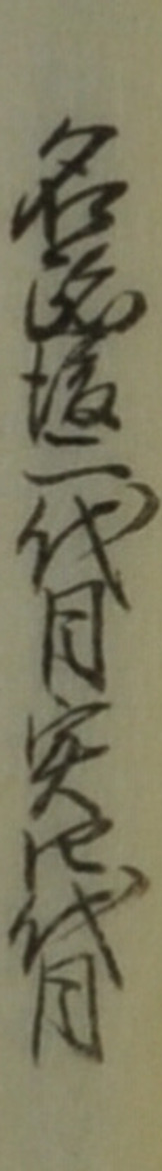名跡後二代目実四代目
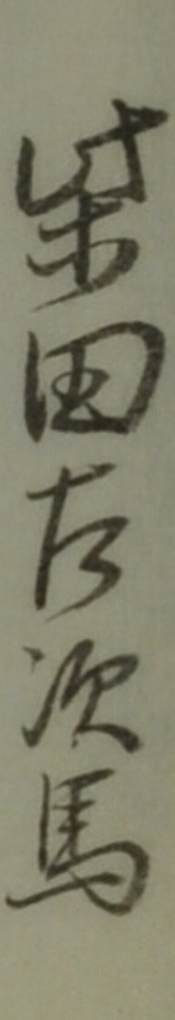柴田左次馬
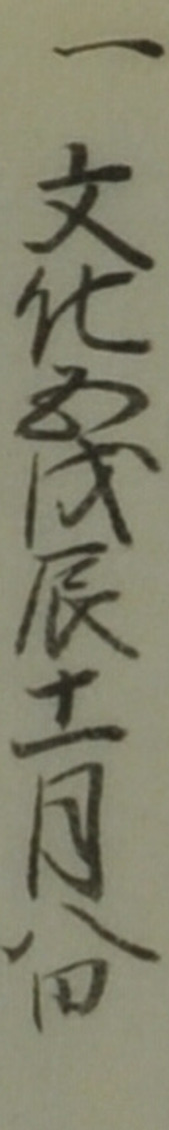一文化五戊辰十一月八日
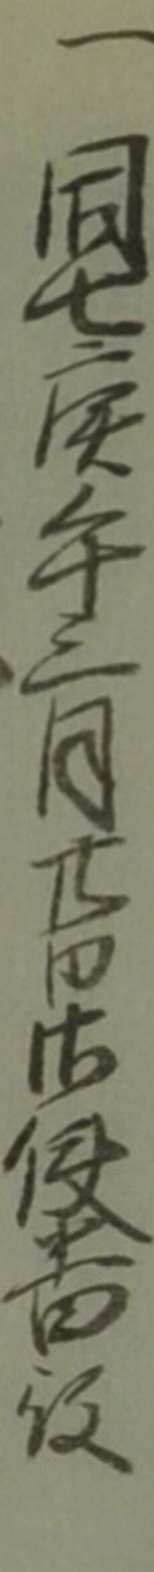一同七庚午三月廿日御役番被
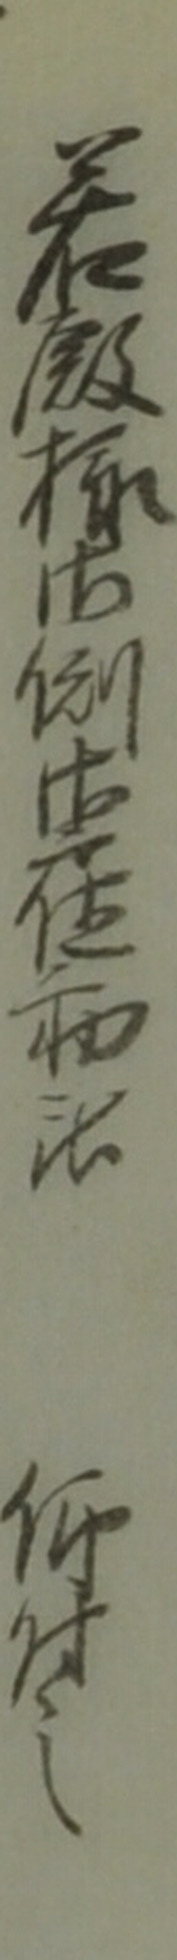若殿様御側御雇勤被仰付之
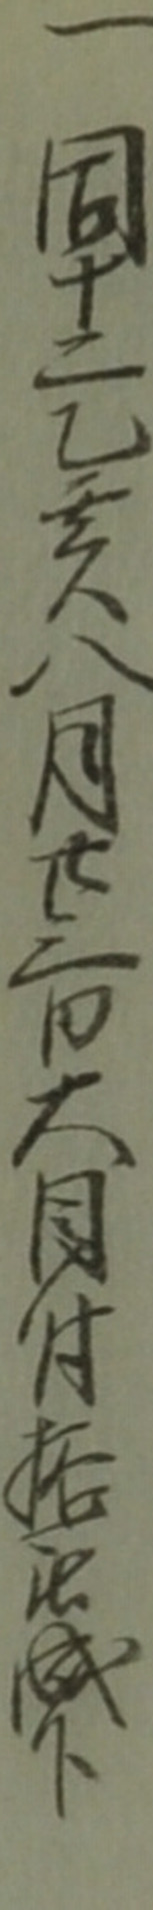一同十二乙亥八月廿三日大目付格被成下
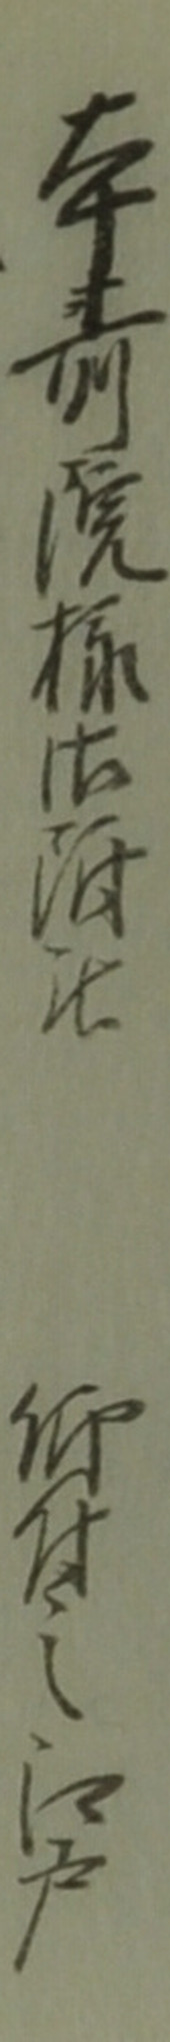本寿院様御附被仰付之江戸
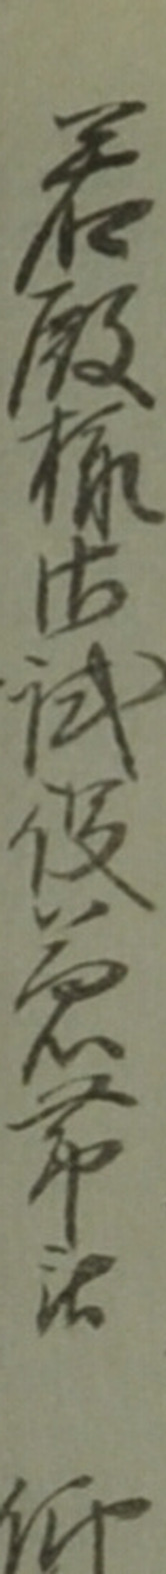若殿様御試役兼帯被仰付之
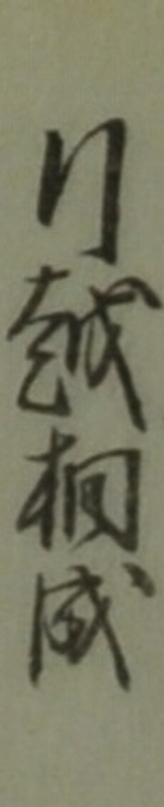引越相成
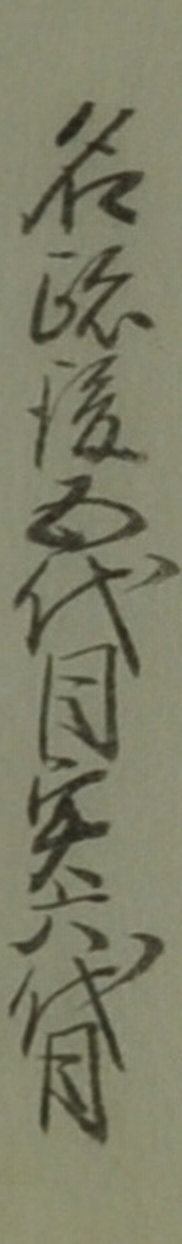名跡後二代目実四代目
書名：諸御役代々録（五）
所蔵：伊那市立高遠町図書館・合同会社AMANE
